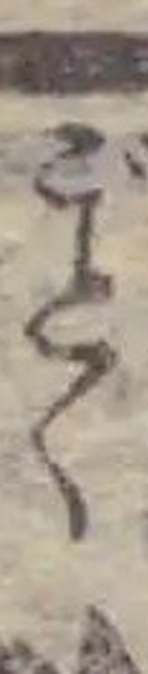ごとく
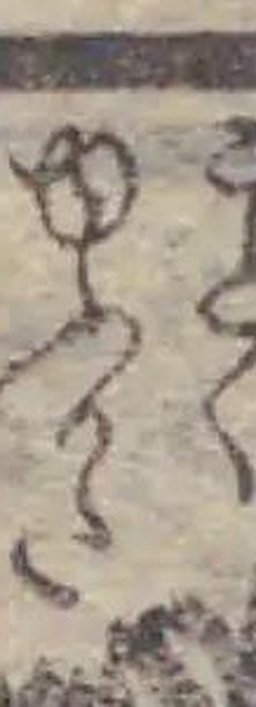ゆふかた
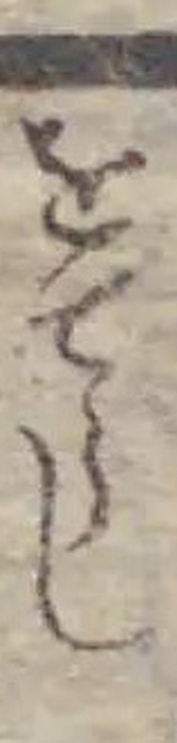をてらし
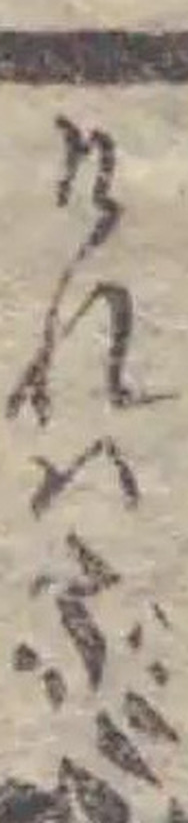けれは
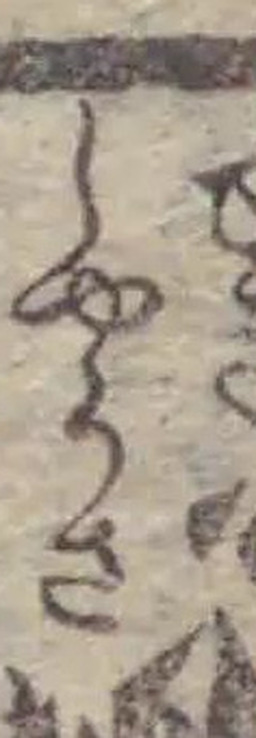しやうさ

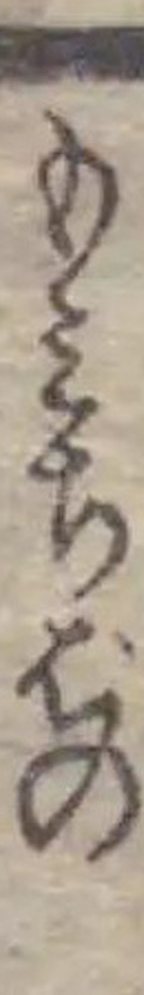もみちはの
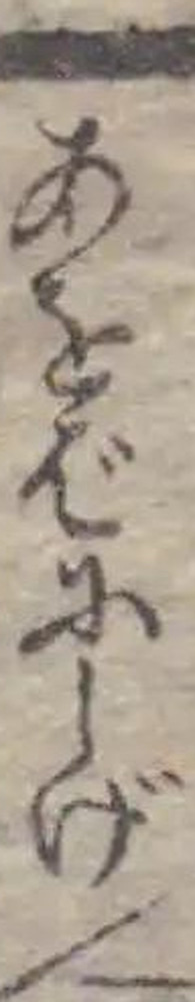あをばにしげ
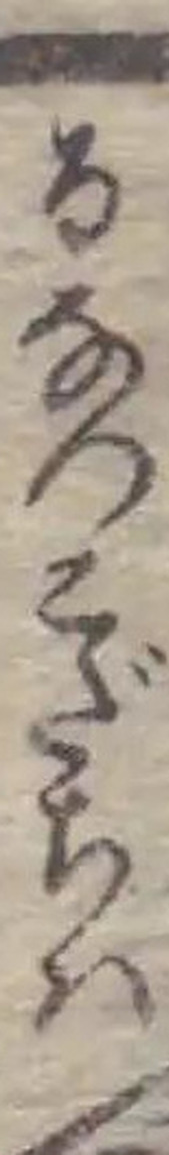るなつこだちは
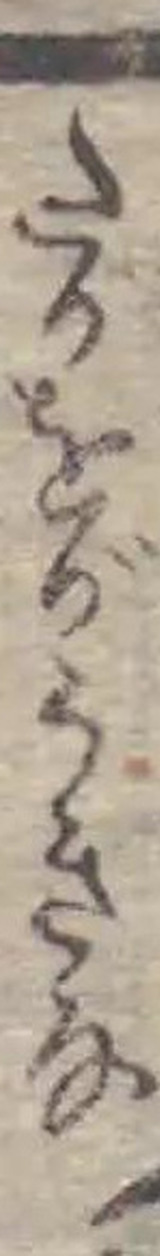たかをがうきな
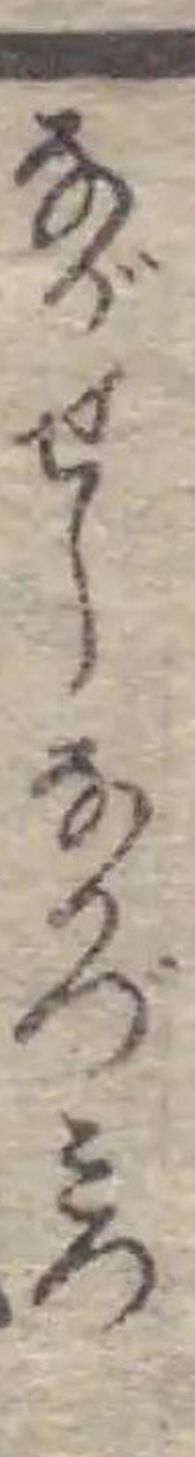ながせしなかづみつ
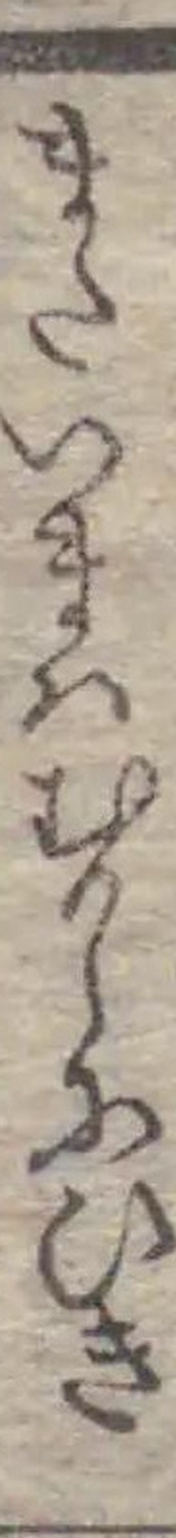またいまはむかしにひき
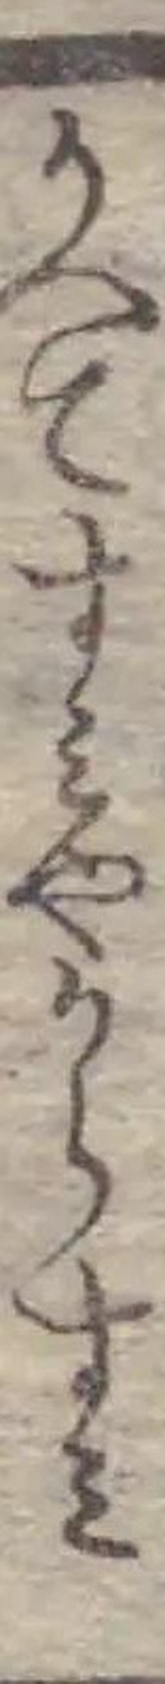かへてすみやからすみ
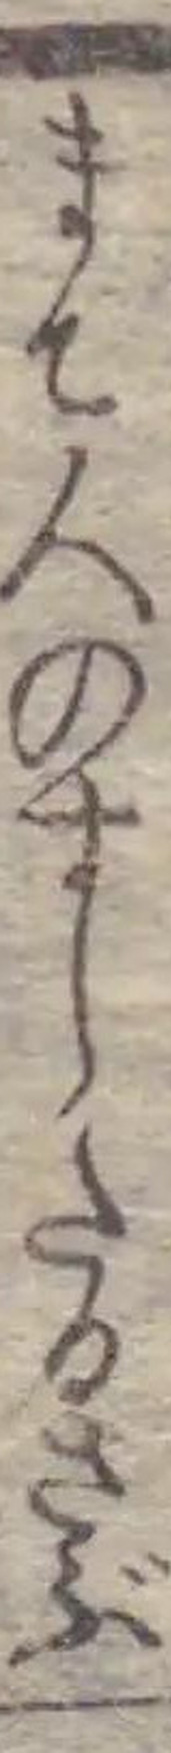まて人のすしたるさぶ
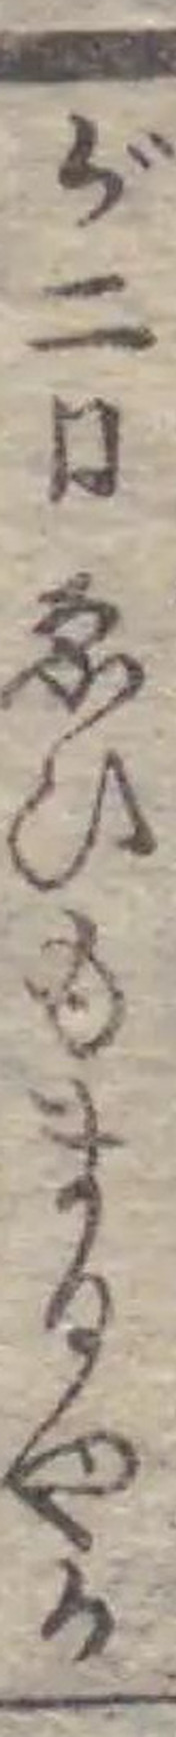が二日ゑひもまるやか
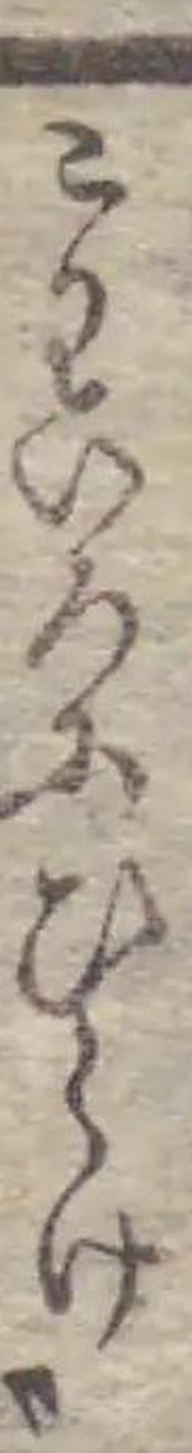こわいろにひらけ
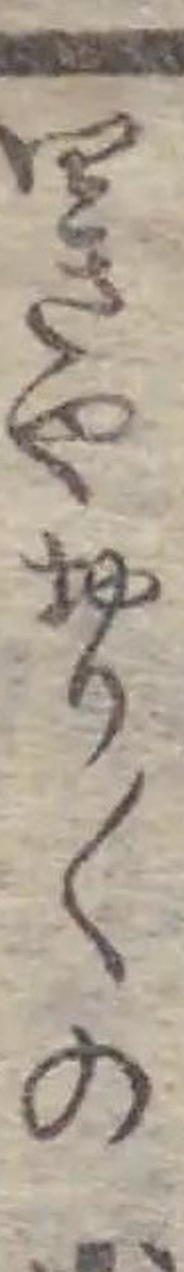四きやおり〳〵の
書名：かんなんの夢枕 2巻
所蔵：国立国会図書館 National Diet Library, JAPAN
